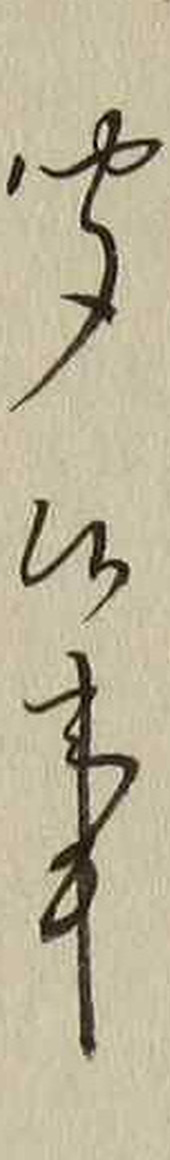聞候事
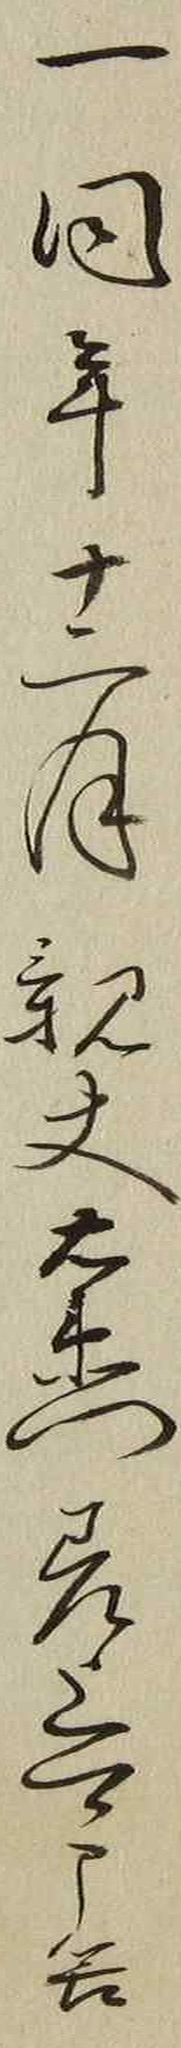一同年十二月親丈右衛門差上可申筈
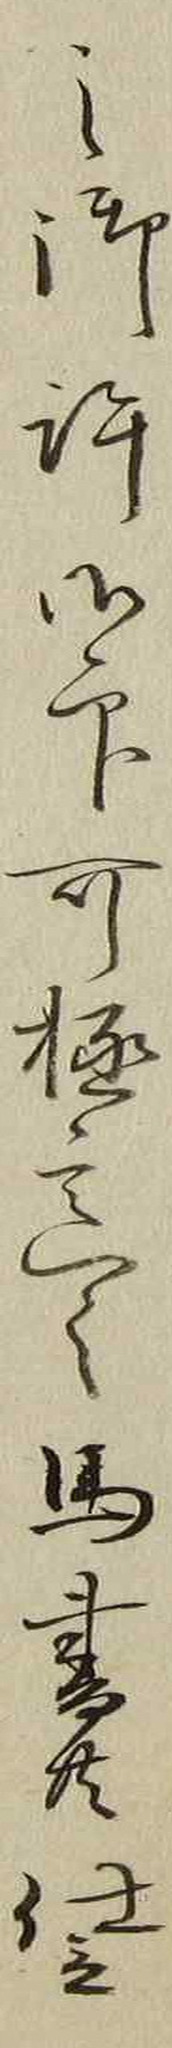之御許御印可極意之馬書共仕立
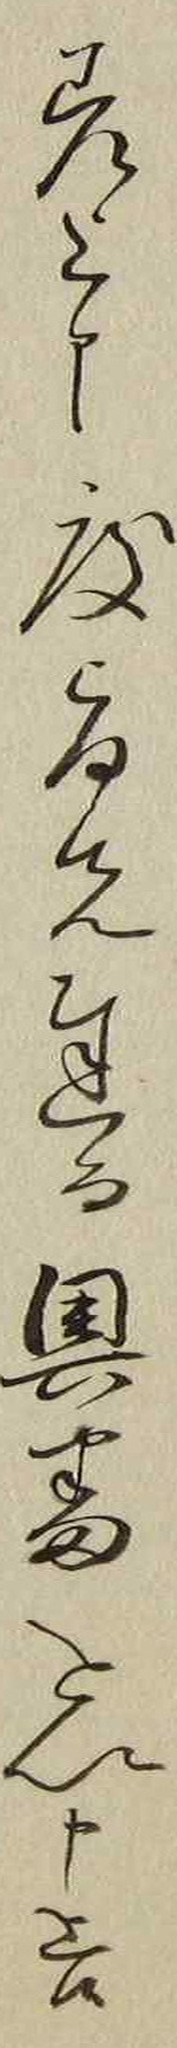差上申度旨先達而奥番を以申上候
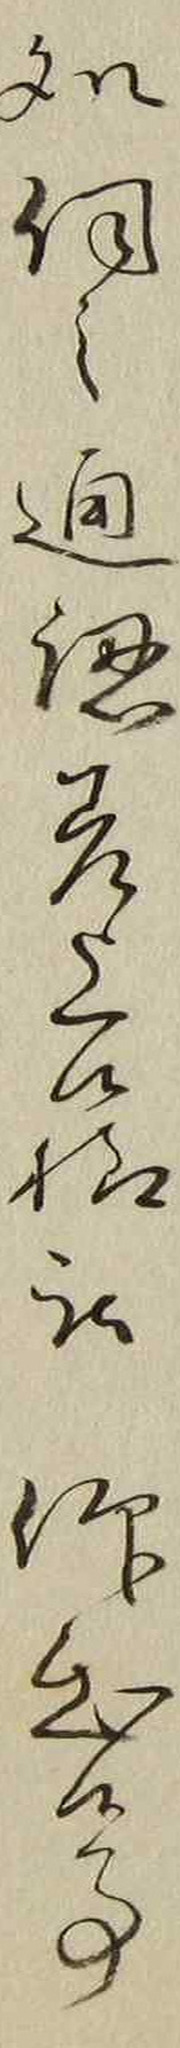処伺之通認差上候様被仰出候事
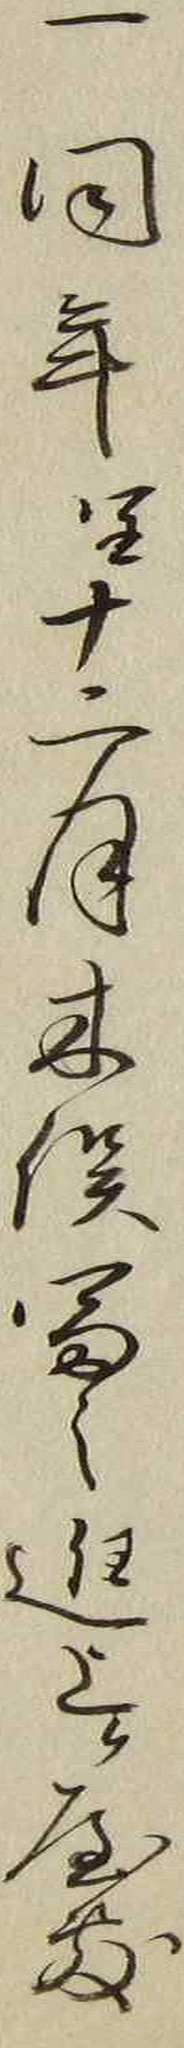一同年閏十二月木俣富之進上ケ屋敷
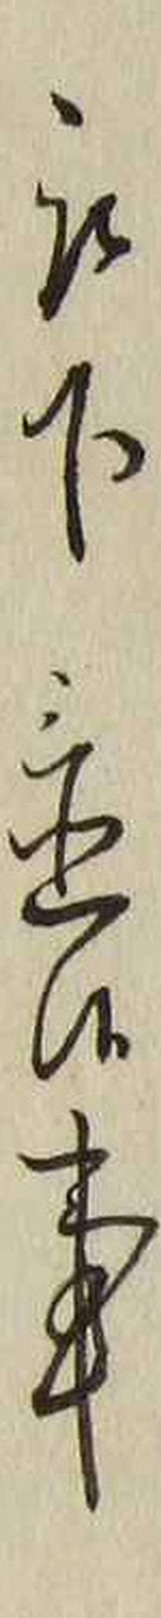被下置候事

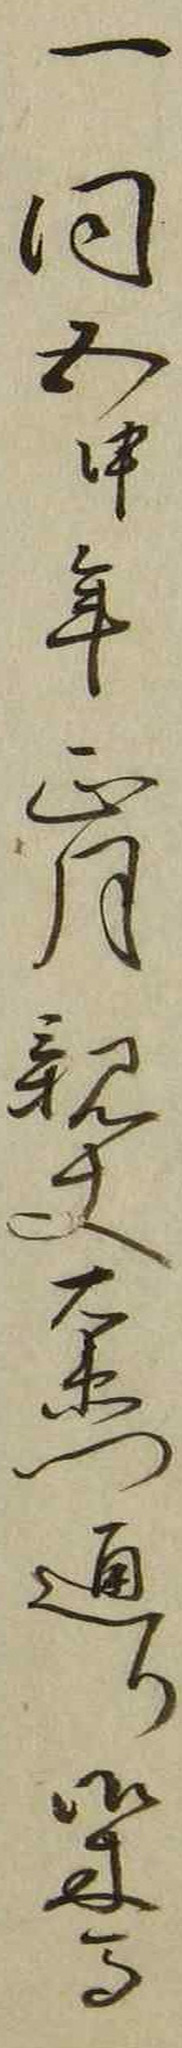一同五申年正月親丈右衛門通り御木馬
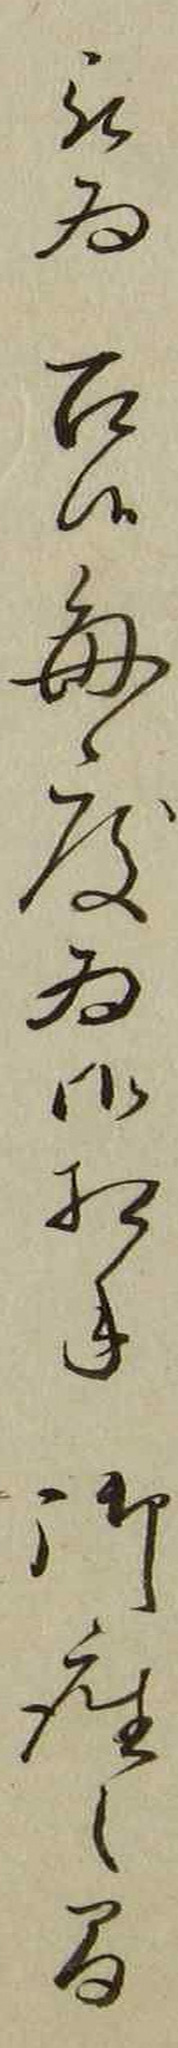被為召候毎度為御相手御座之間
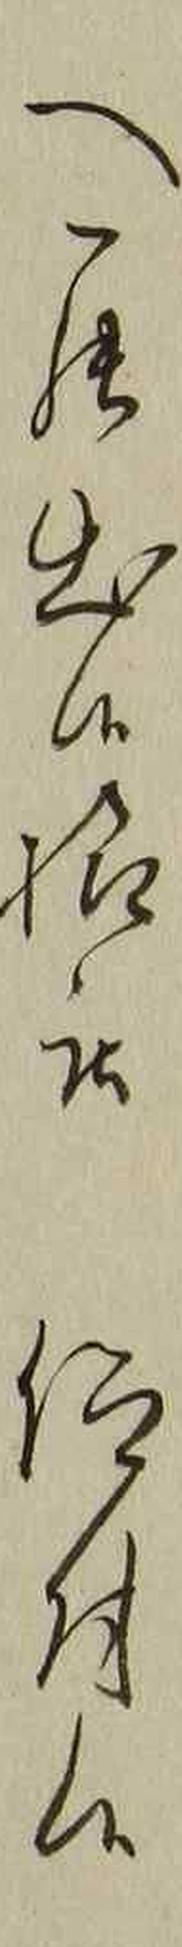へ罷出候様被仰付候
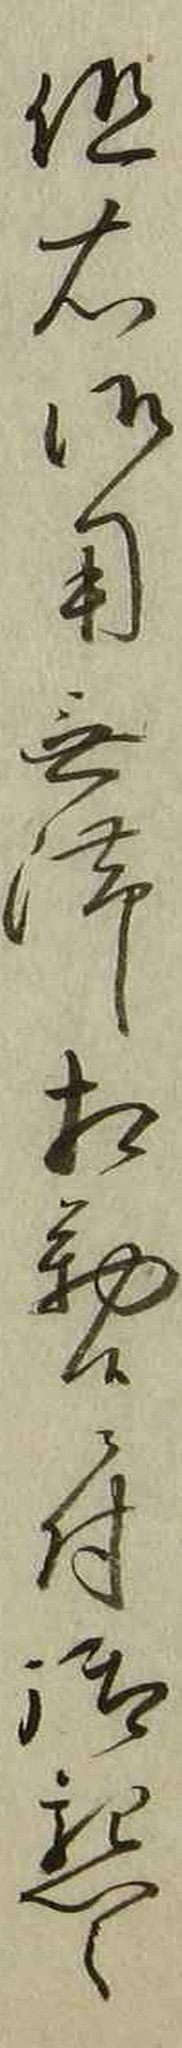但右御用無滞相勤候ニ付御懇之
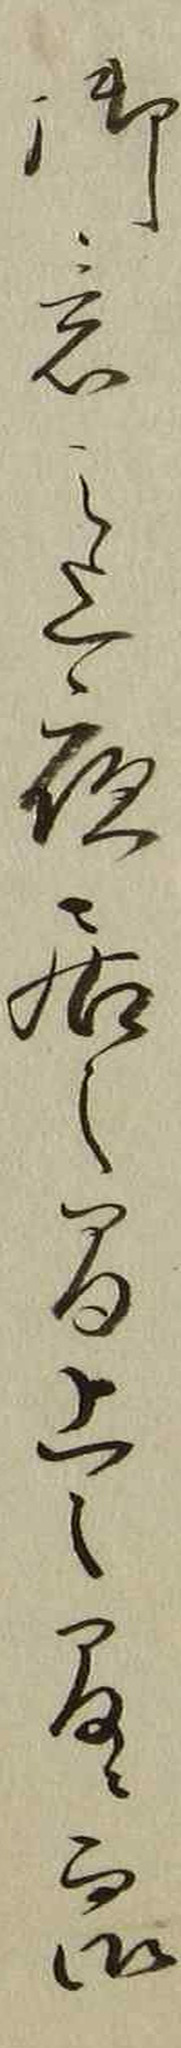御意之上夜居之間上之間ニ而御
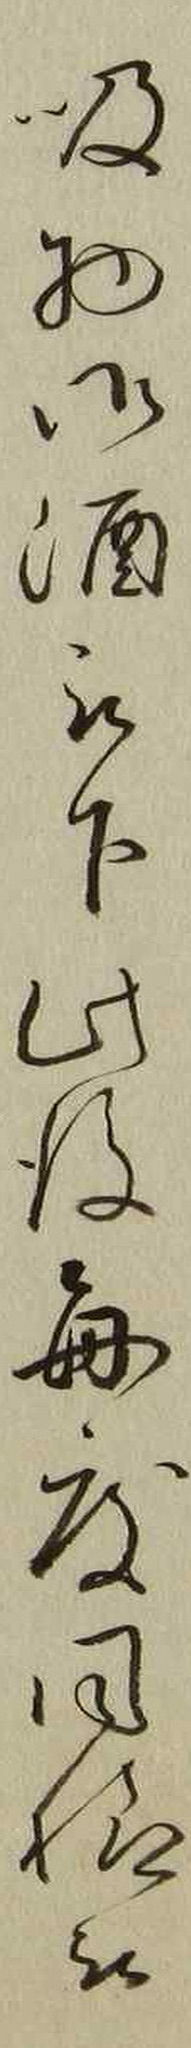吸物御酒被下此後毎度同様被
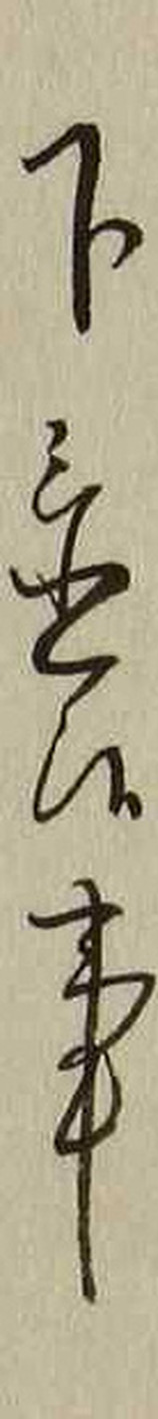下置候事
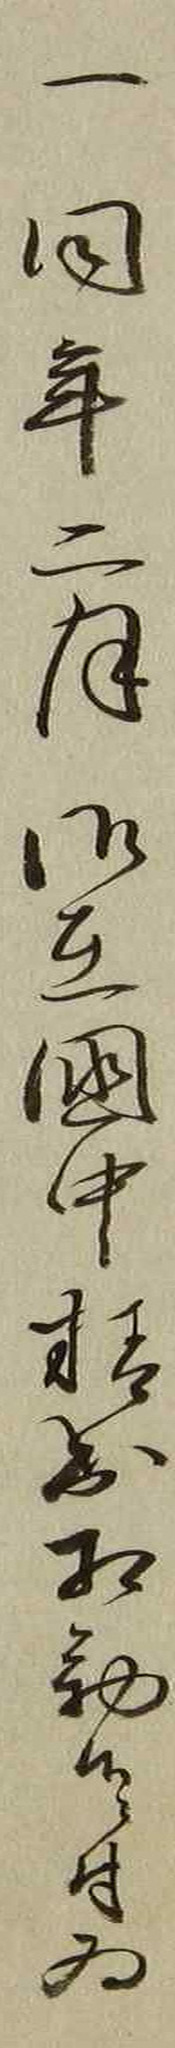一同年二月御在国中精出相勤候ニ付為
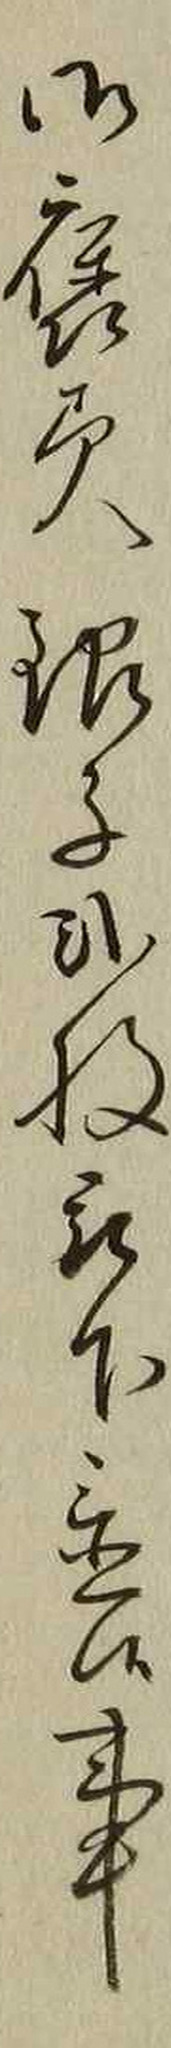御褒美銀子弐枚被下置候事
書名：諸士系譜　巻之3　い之部3
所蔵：会津若松市立会津図書館
